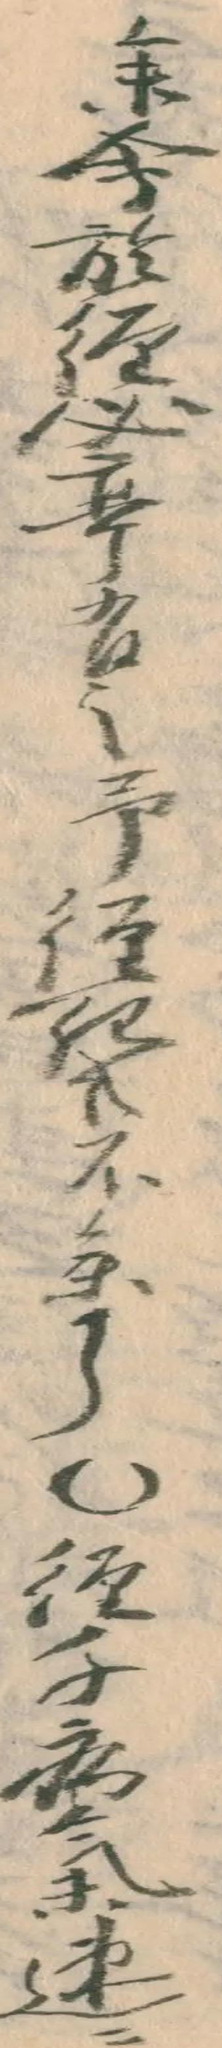参會於経必亭有之予経紀共不参了◯経千病氣速に
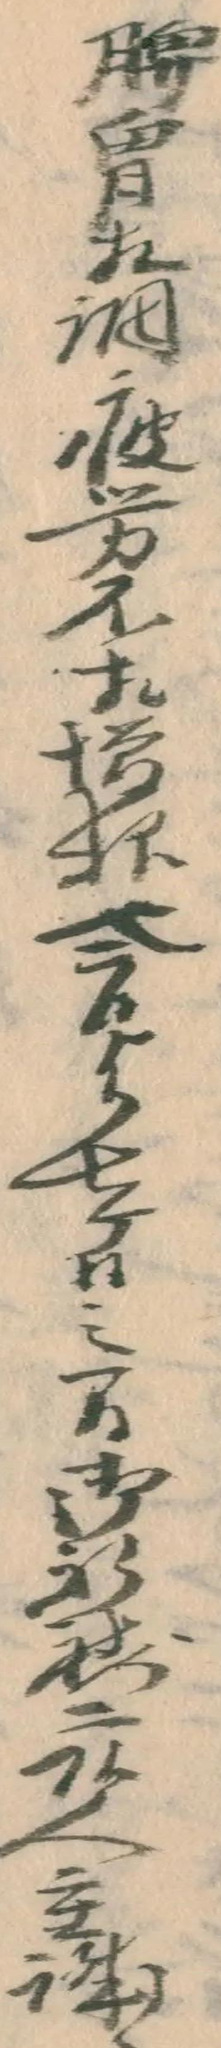臍胃相調疲労不相増様今日より七ケ日之間御祈祷二頭人重補へ
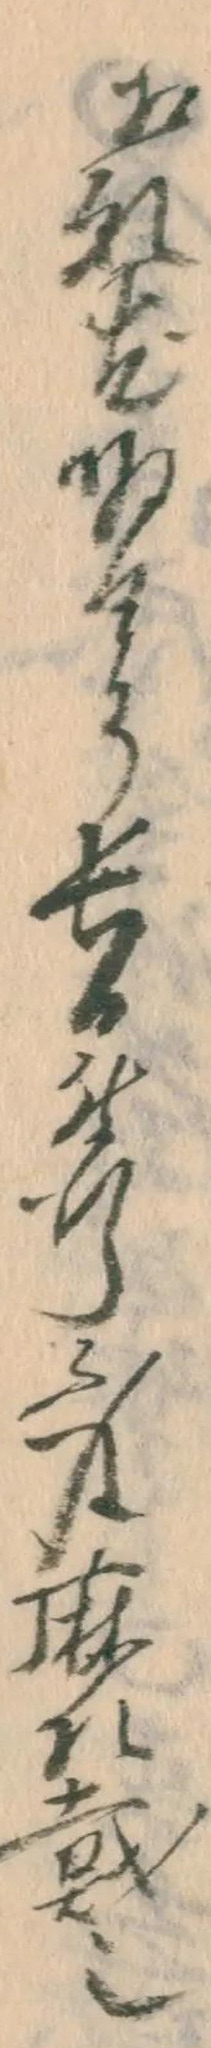相願尤明日より長日付行不及麻頂戴也
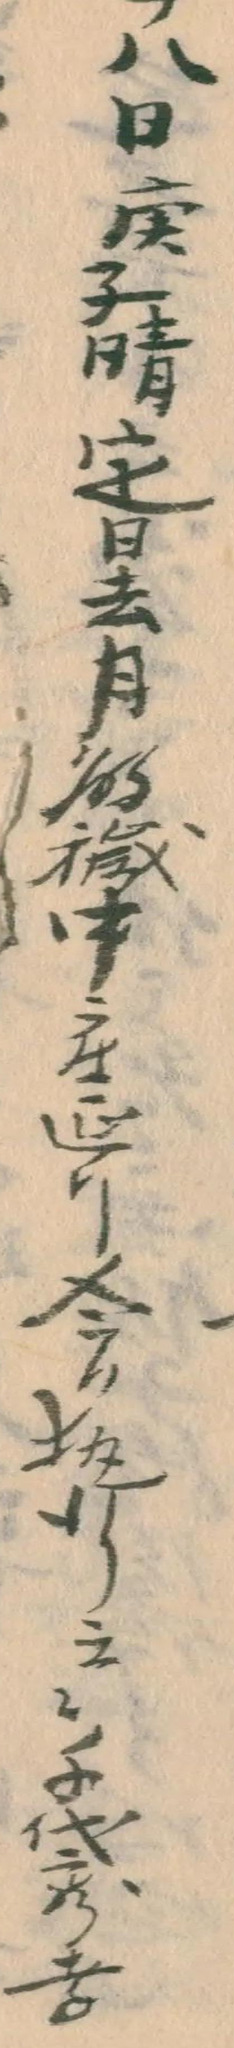十八日庚子晴定日去月触穢中ニ付延引今日執行云々千代蔵吉
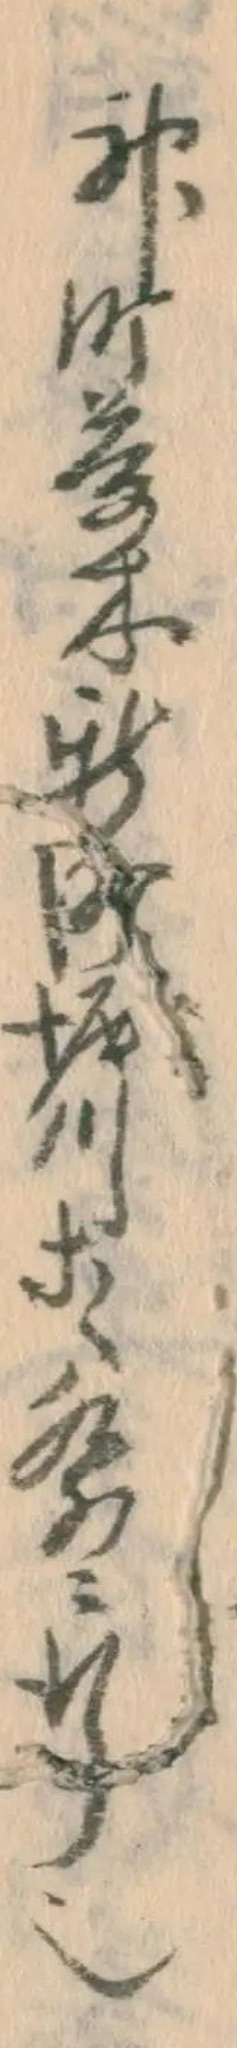神町藤木新堀川等へ祭に行事也
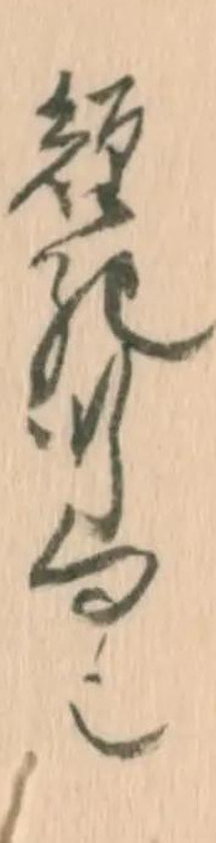経紀行向也
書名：賀茂社記録. 第70冊
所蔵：国立国会図書館 National Diet Library, JAPAN
